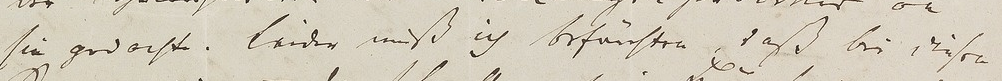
sie gedacht. Leider muß ich befürchten, daß bei diesen
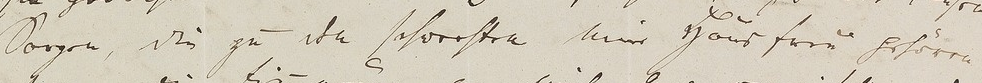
Sorgen, die zu den schwersten einer Hausfrau gehören
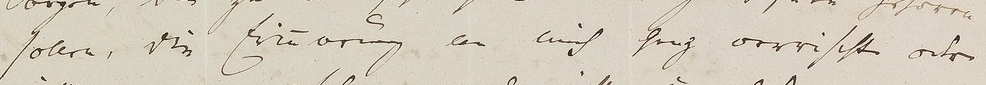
sollen, die Erinnerung an mich ganz verwischt oder
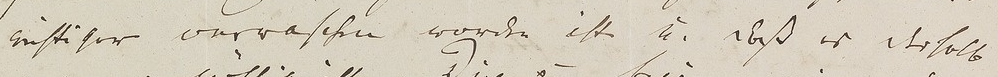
richtiger verwaschen worden ist u. daß es deshalb
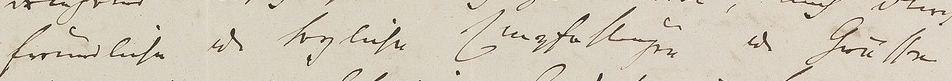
freundliche u. herzliche Empfehlungen u. Grüsse
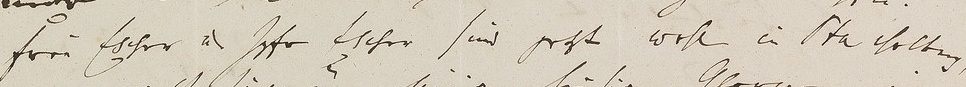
Frau Escher u. Jgfr Escher sind jetzt wohl in Stachelberg,
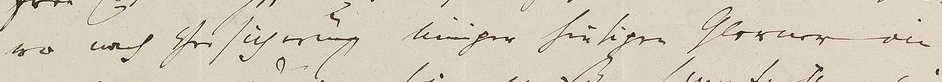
wo nach Versicherung einiger hiesiger Glarner ein
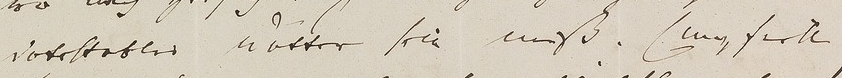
detestables Wetter sein muß. Empfiehl
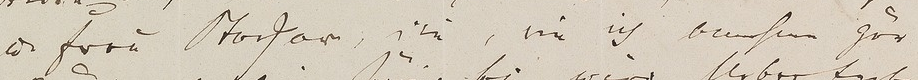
u. Frau Stockar, die, wie ich annehme zur
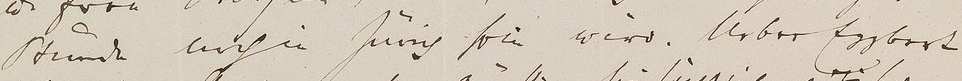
Stunde noch in Zürich sein wird. Ueber Eggbert
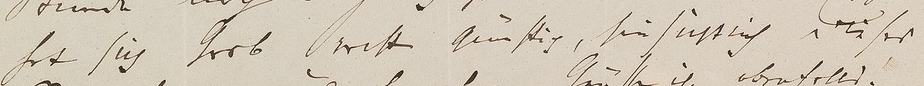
hat sich Grob recht günstig, hinsichtlich dieses
